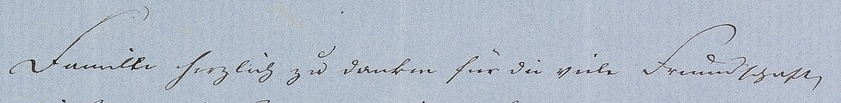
Familie herzlich zu danken für die viele Freundschaft,
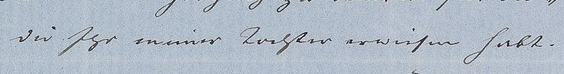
die Ihr meiner Tochter erwiesen habt.
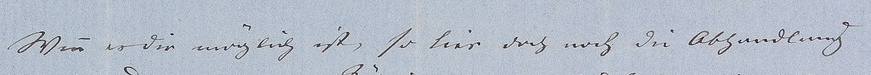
Wenn es dir möglich ist, so lies doch noch die Abhandlung
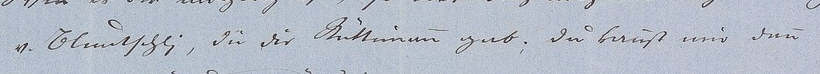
v. Bluntschli, die dir Rüttimann gab; du kannst mir dann
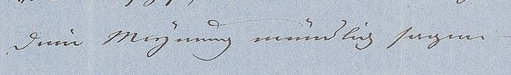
Deine Meynung mündlich sagen. –
